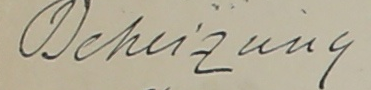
Beheizung
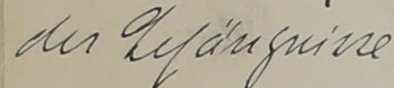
der Gefängnisse
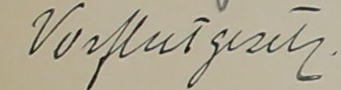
Vorflutgesetz
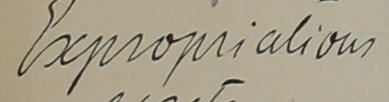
Expropriations
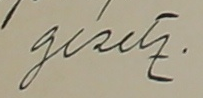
gesetz
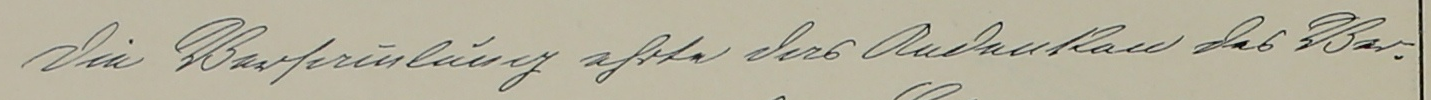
Die Versammlung ehrte das Andenken des Ver-
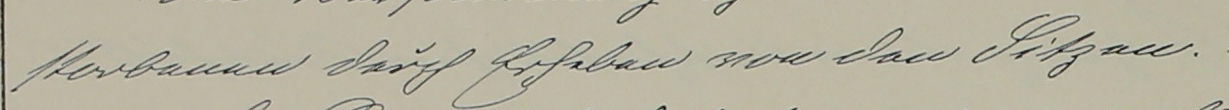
storbenen durch Erheben von den Sitzen.
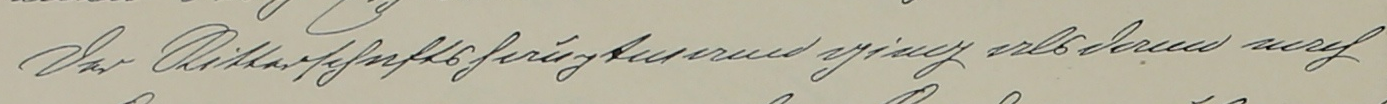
Der Ritterschaftshauptmann ging alsdann nach
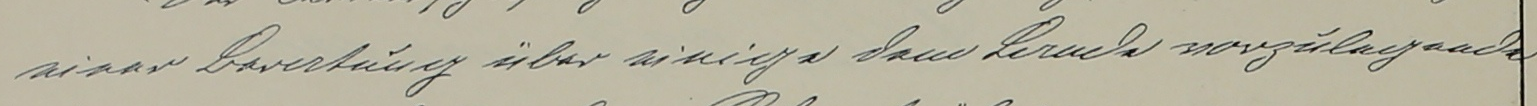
einer Beratung über einige dem Lande vorzulegende
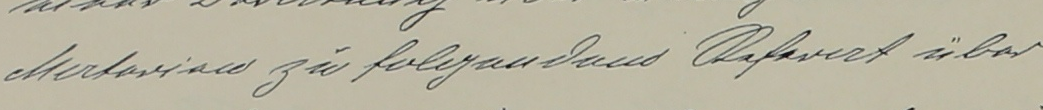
Materien zu folgendem Referat über:
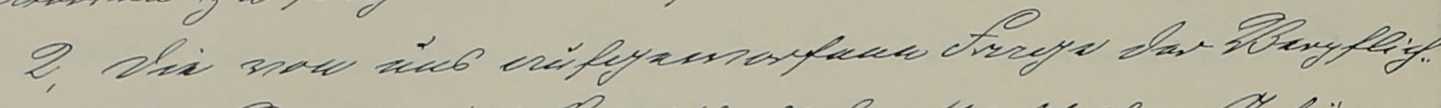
2. Die von uns aufgeworfene Frage der Verpflich-
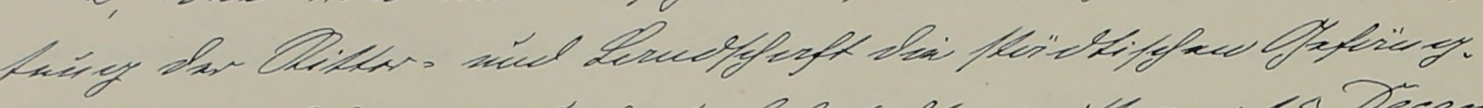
tung der Ritter- und Landschaft die städtischen Gefäng-
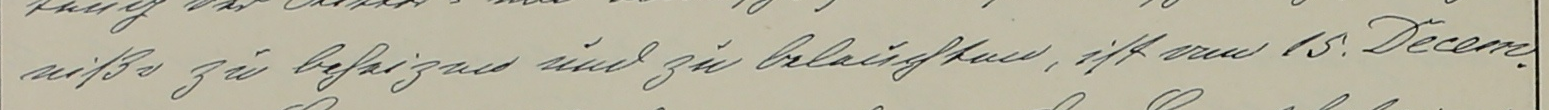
niße zu beheizen und zu beleuchten, ist am 15. Decem-
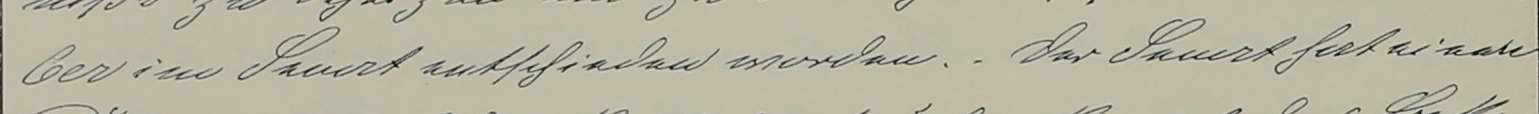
ber im Senat entschieden worden. Der Senat hat einen
